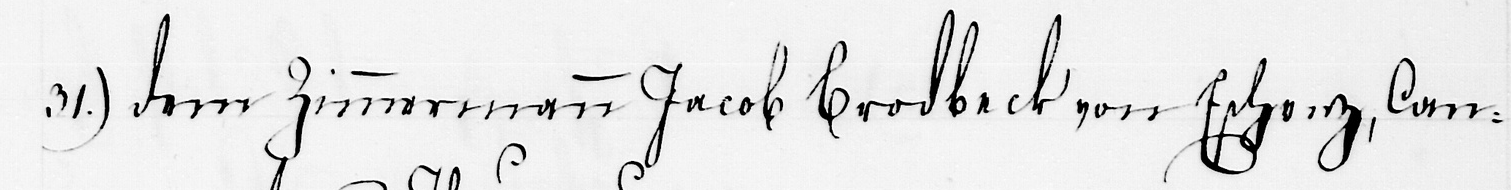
31.) dem Zimmermann Jacob Brodbeck von Eschenz, Can¬
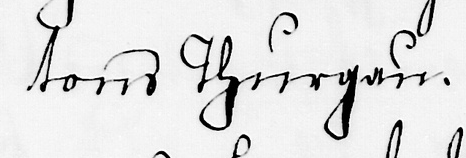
tons Thurgau.
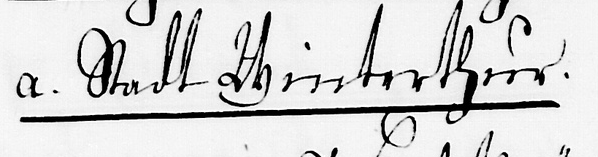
a. Stadt Winterthur.
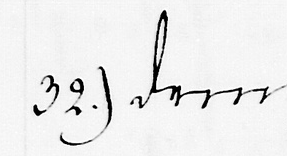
32.) de¬
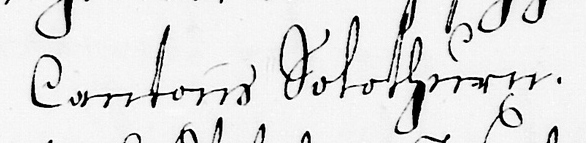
Cantons Solothurn.
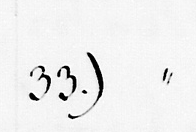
33.)
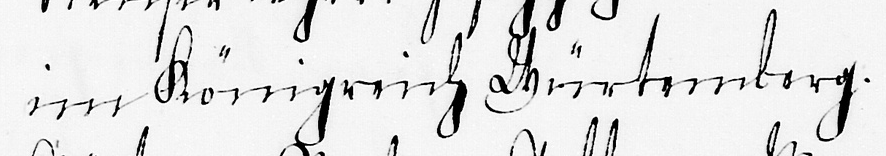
im Königreich Würtemberg.
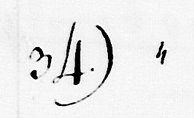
34.)
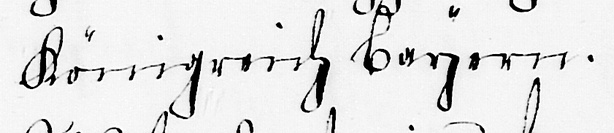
Königreich Bayern.
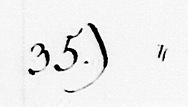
35.)
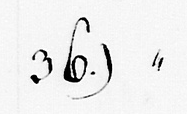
36.)
